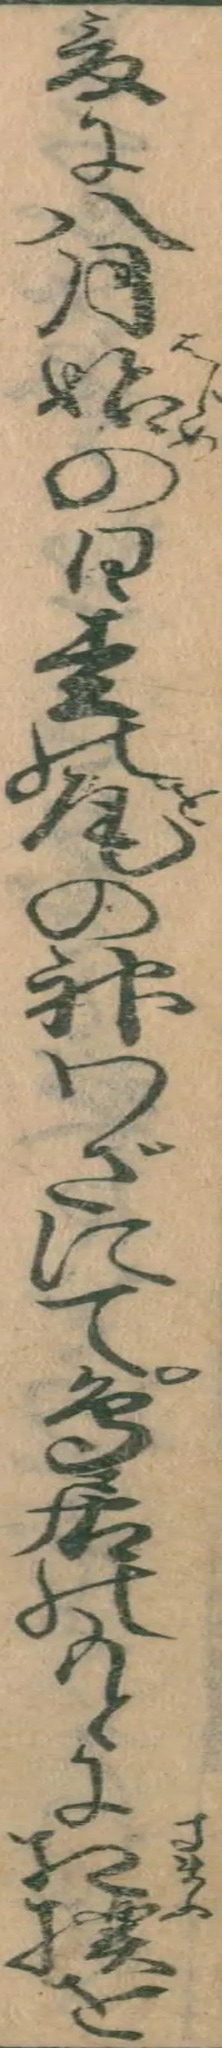爰に八月始の日松の尾の神わざにて。鳥居のもとに相撲を
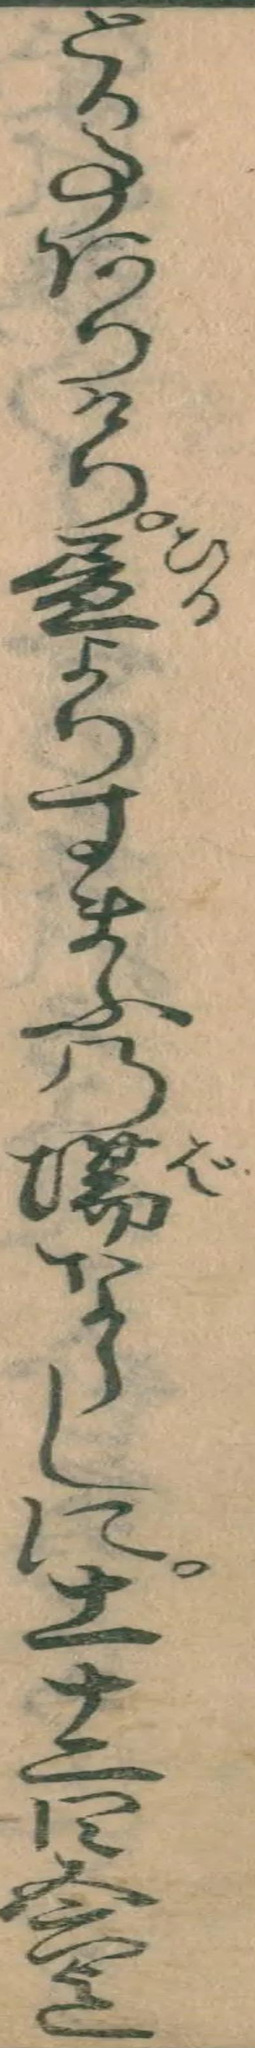とる事ありけり。昼よりすまふの場ならしに。十一十二四五六迄
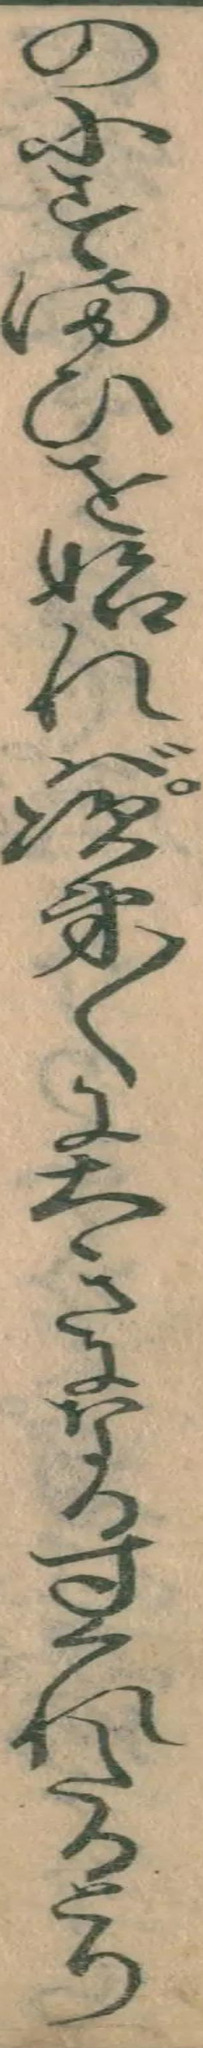の小すまひを始れば。次第〳〵に大きになるすくれたるとり
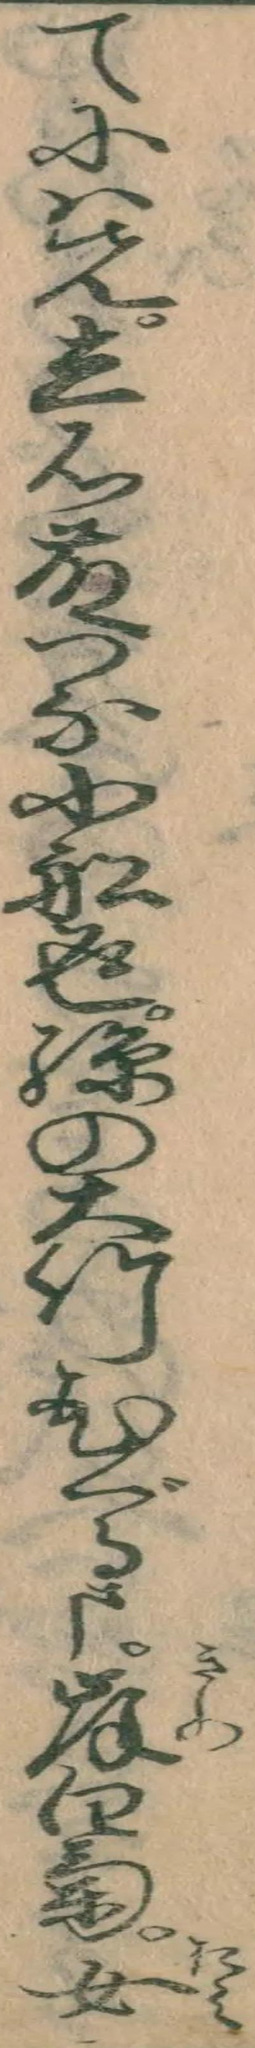てには先。立石藤つな小船返。源の大竹飛ぐるま。岸白菊。女
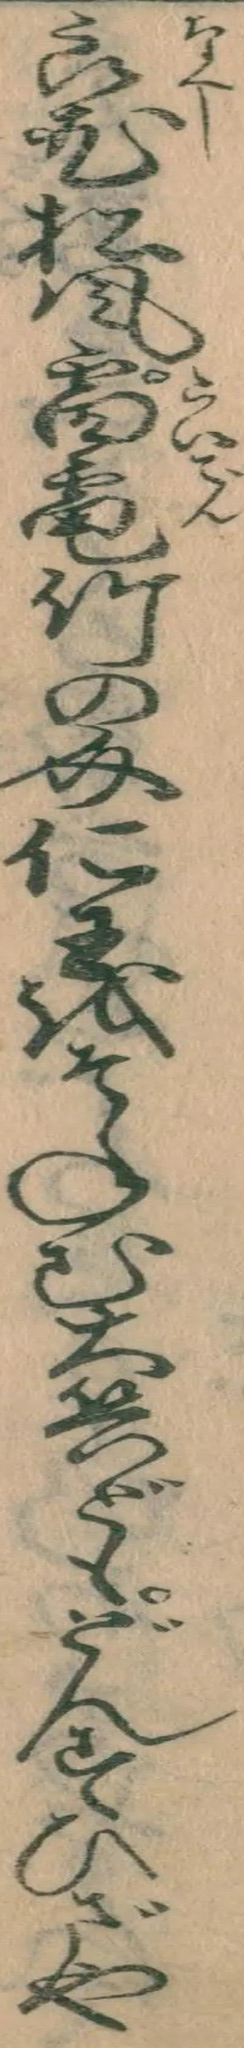郎花松風。雷電竹の介仁王をそねむ大兵ども。どんすひざや
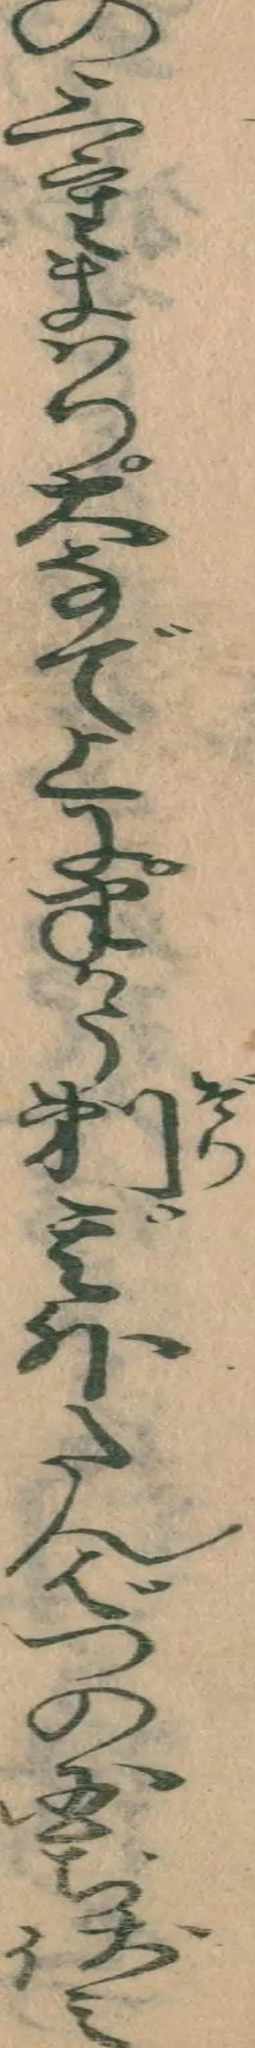の三重まわり。大なで上に。半かう剃。其外たんばつの国ぢ伏み
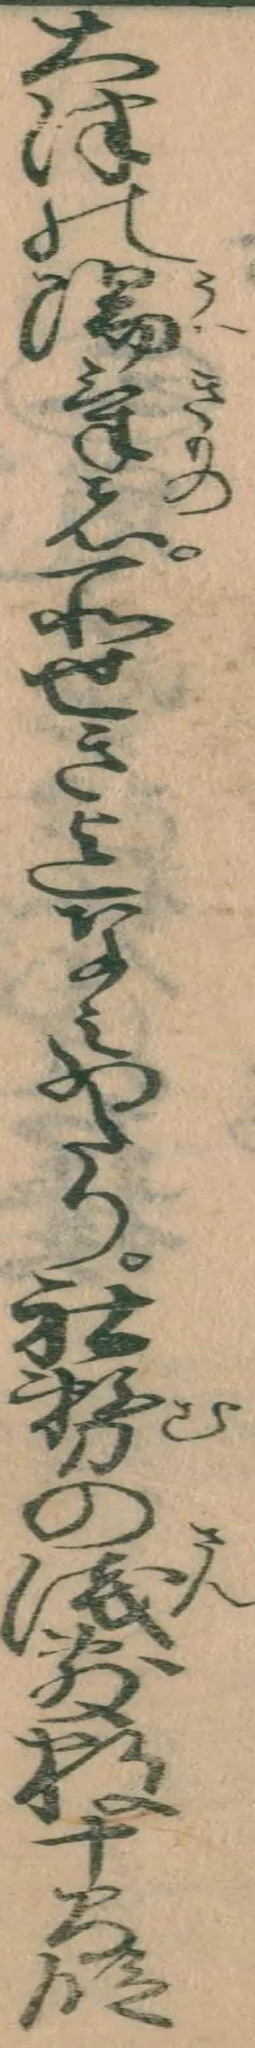大津の陽気者。所せき迄なみゐたり。社務の浅敷数十間段
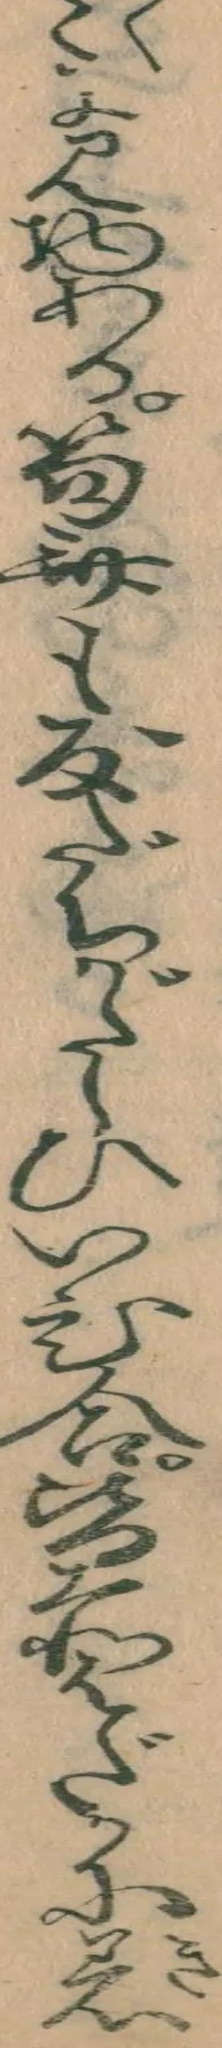たに見物ある。筍斎も友だちがたらひいひ合。皆赤はだかに着
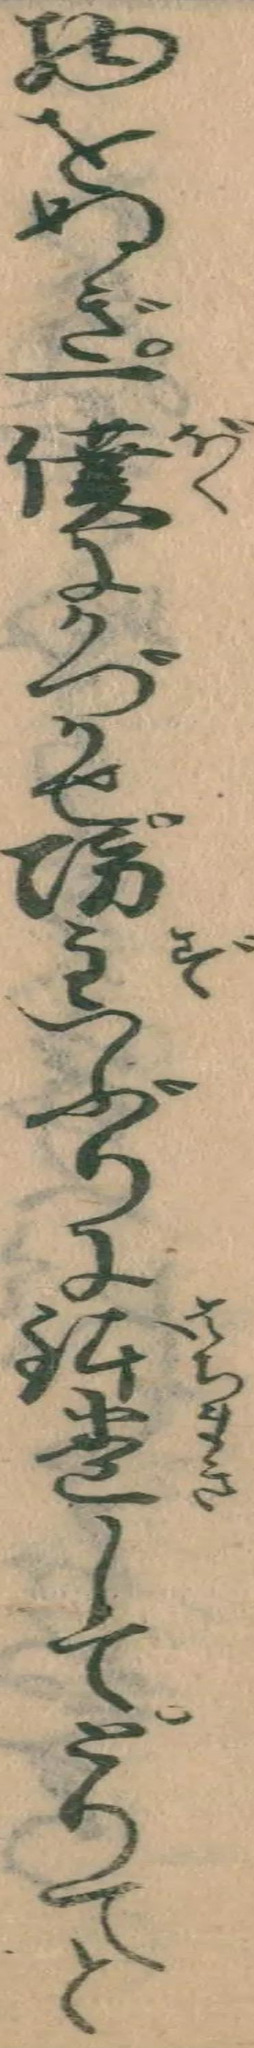物をぬぎ。一僕にかづかせ。坊主つぶりに鉢巻して。とりてと
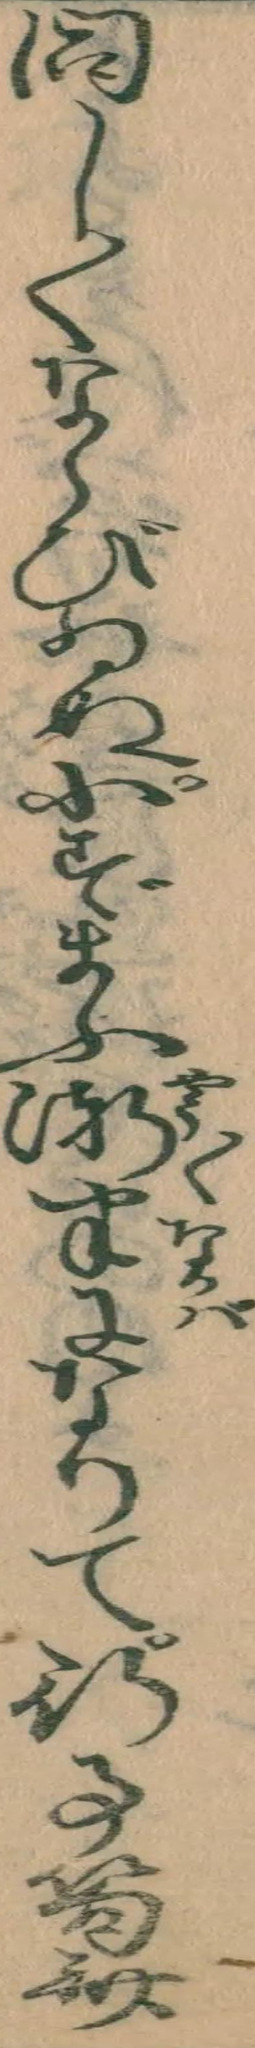同し〱ならびゐぬ。小ずまふ漸半になりて。行事筍斎
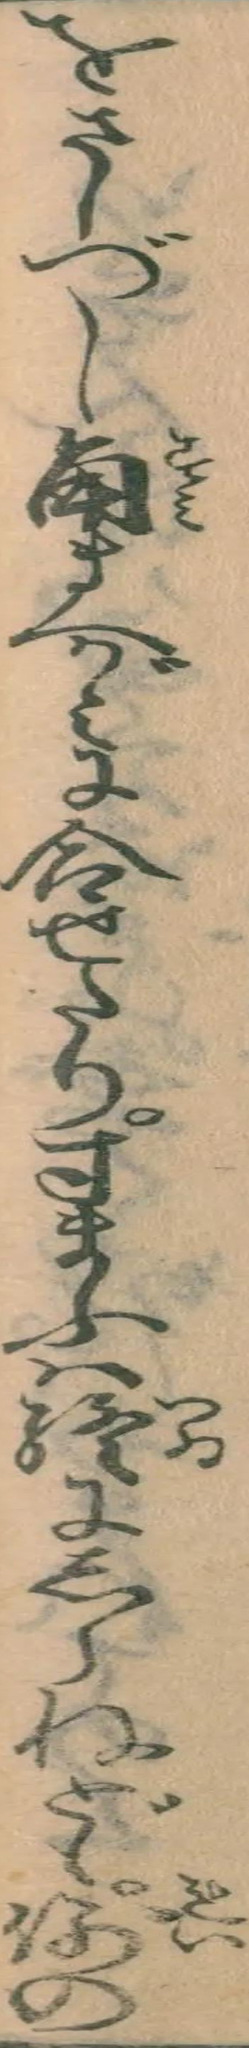をさしづし角まへがみに合せたり。すまふは終にしらねども。例の
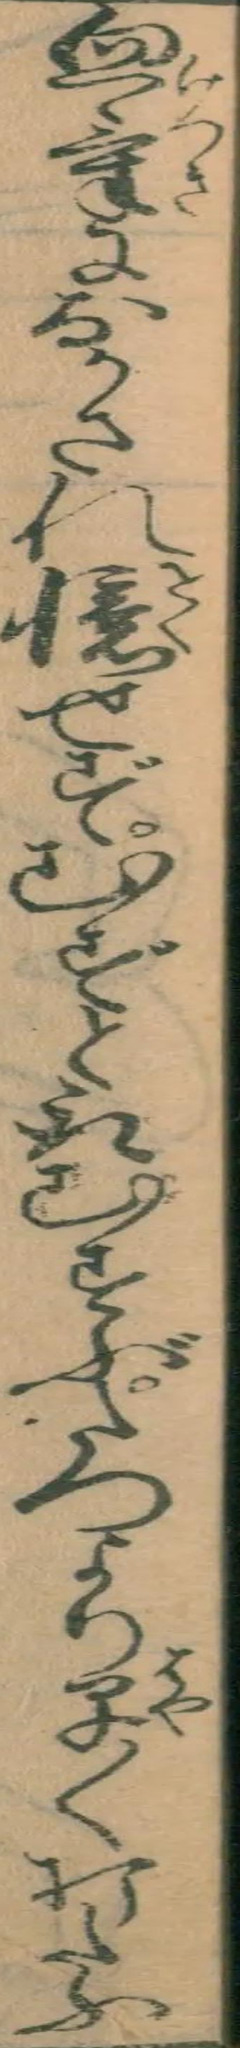血気におかされ憶せず。むずと取むすぶ。たつより早〱打たふ
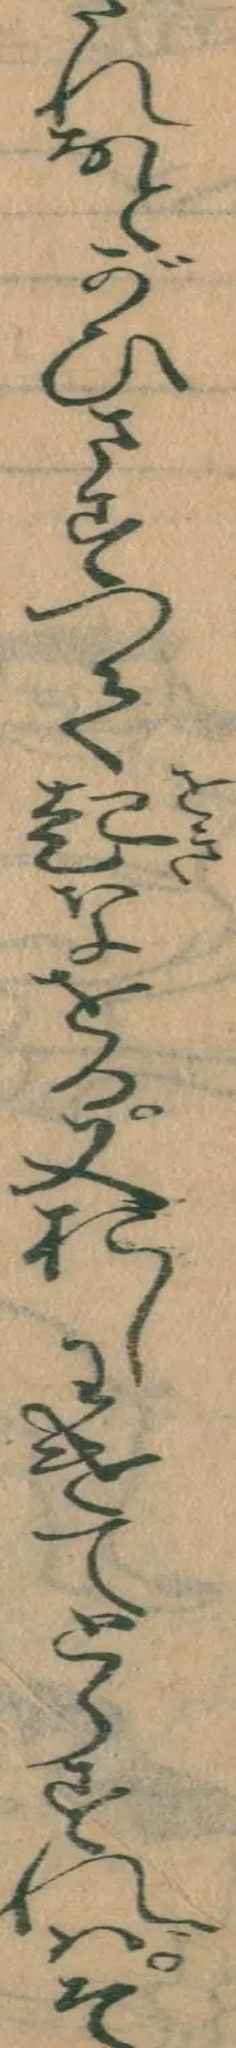されおとがひさすつて起なをる。又おしわけてとらすれば。そ
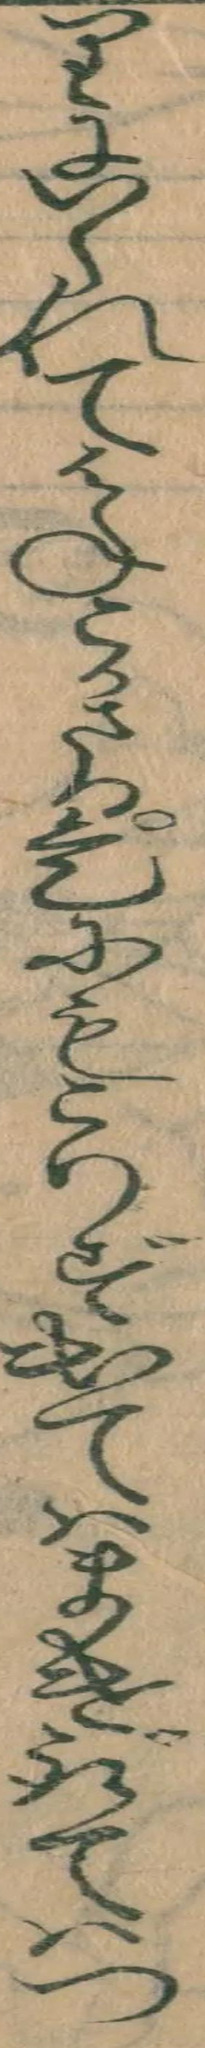りにいられてはねこかさる。是にもこりず出てはまけ。取てはつ
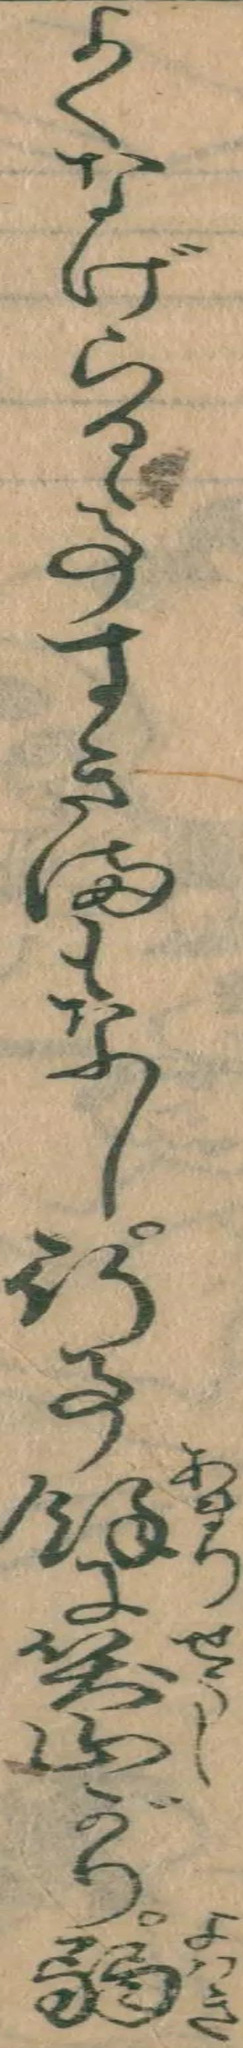よくなげらるゝ事すきまもなし。行事余に笑止がり。弱
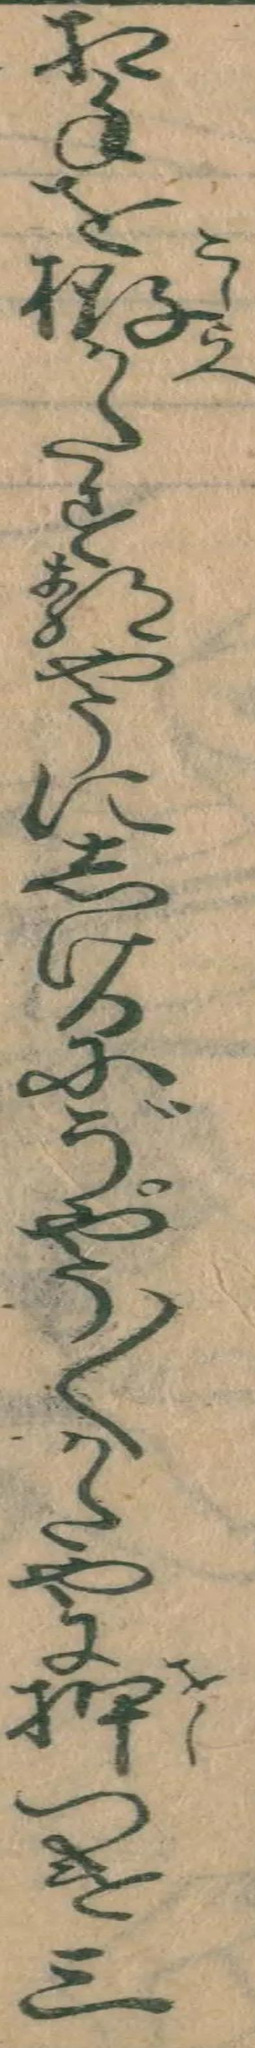相手を拵かたするやうにしけるにぞ。やう〳〵かたやに押つけ三
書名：新竹斎 5巻
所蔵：国立国会図書館 National Diet Library, JAPAN
